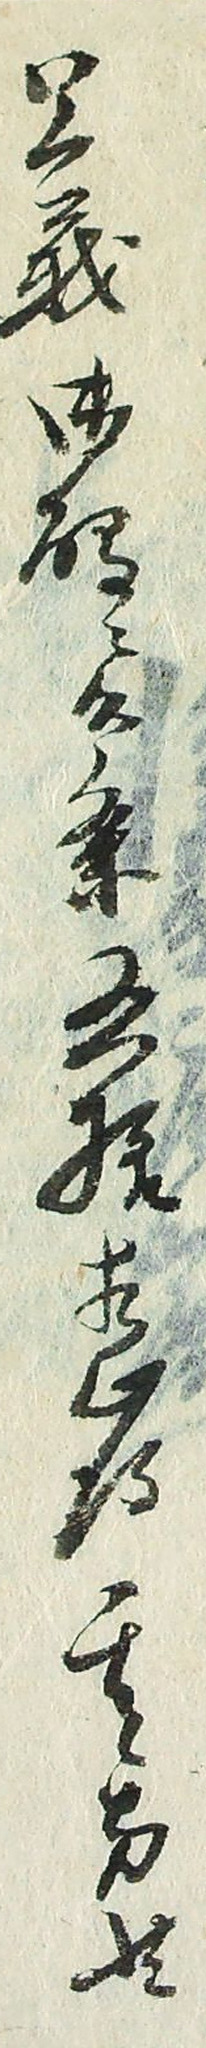公義御触に候条右様相心得其方共
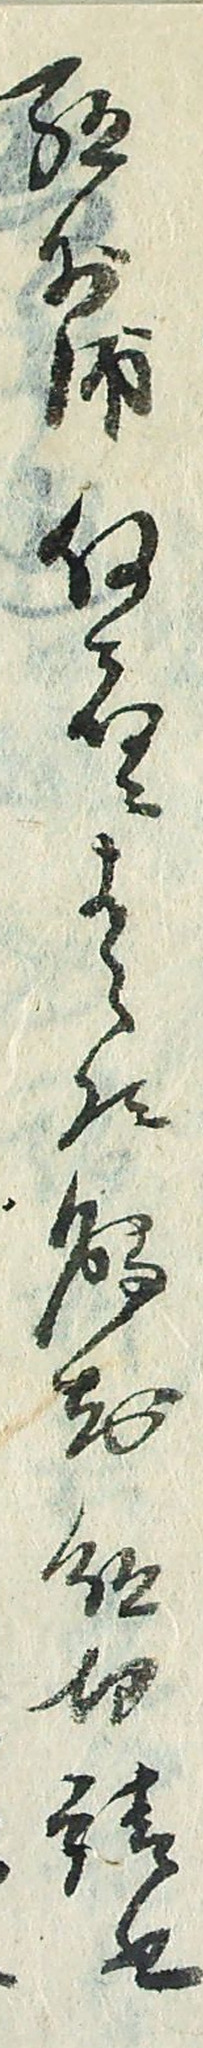組村浦何者によらす触知組切請書
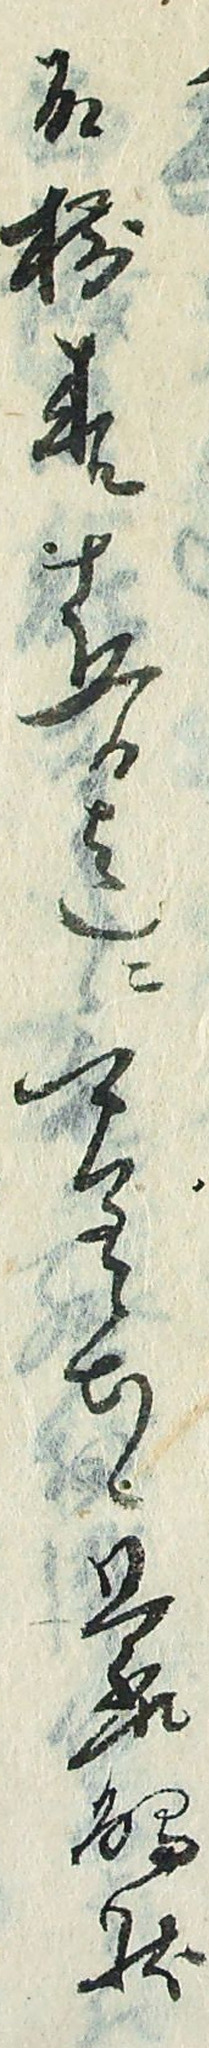取揃来る十五日迄に可差出候且此触状
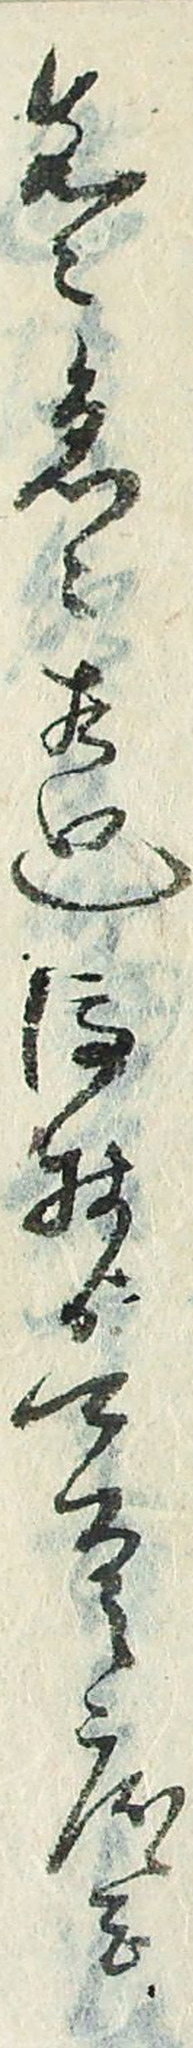先々急々相廻済村ゟ可差戻以上

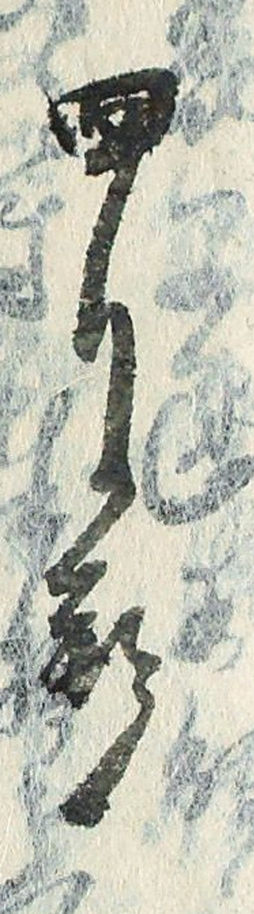四月朔日
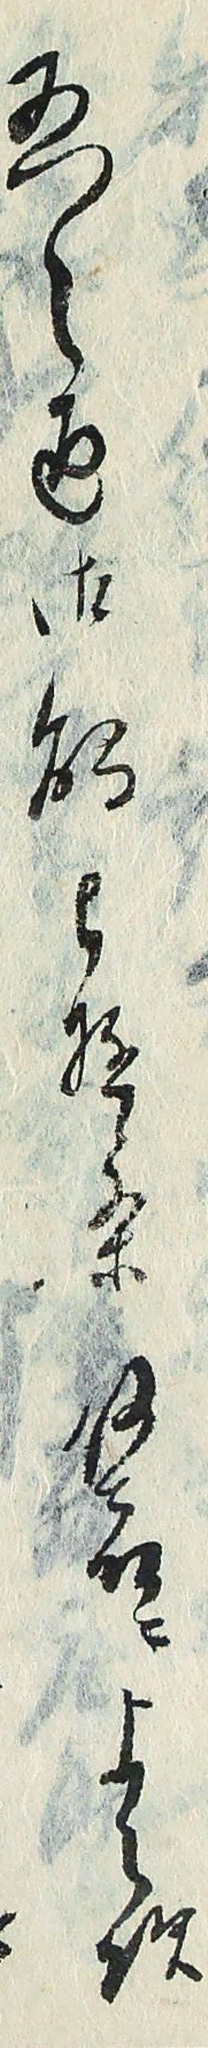右之通御触被遊候条何者によらす
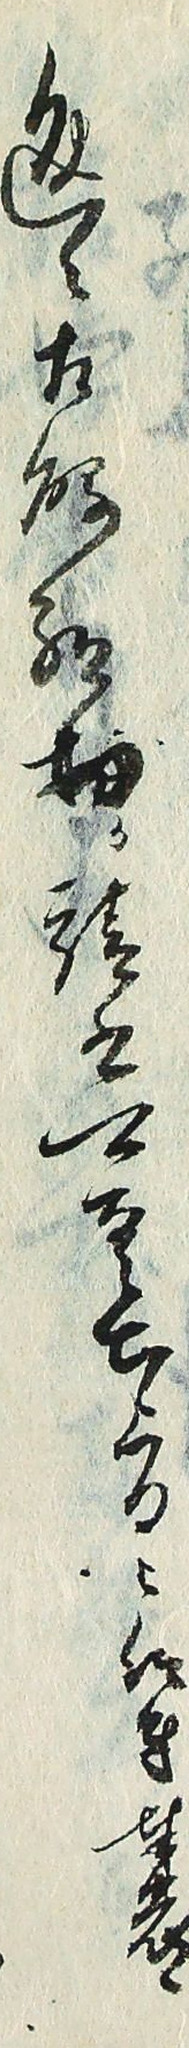逸々相触組切り請書可差出旨被仰付奉畏候
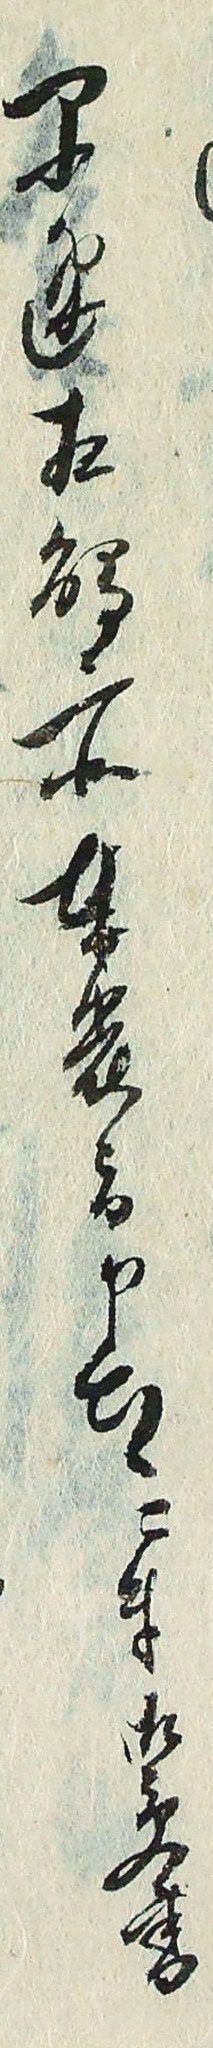早速相触候所奉畏旨申出候に付御受書
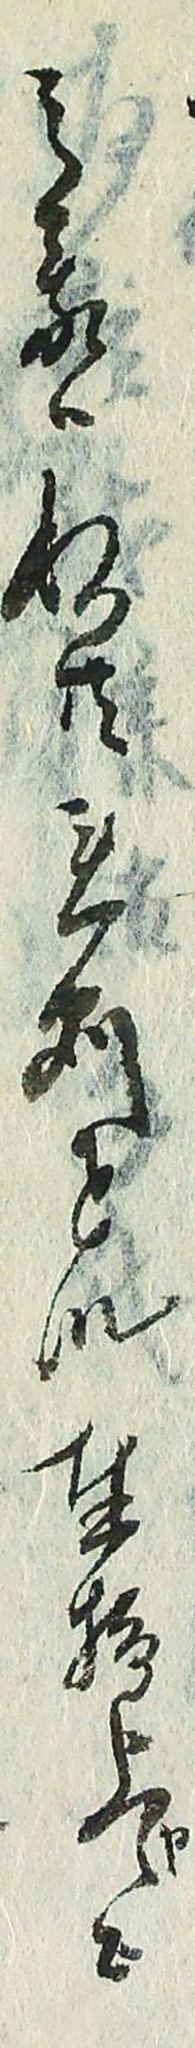之義は私共連判を以奉指上申候以上
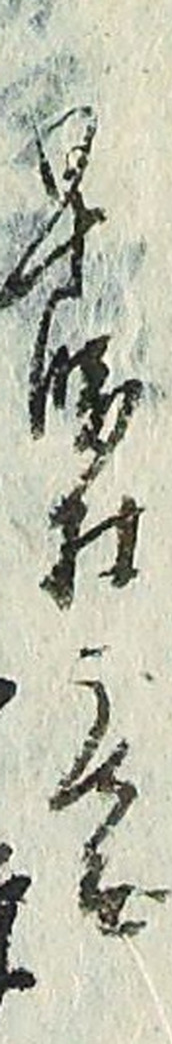早淵村庄屋
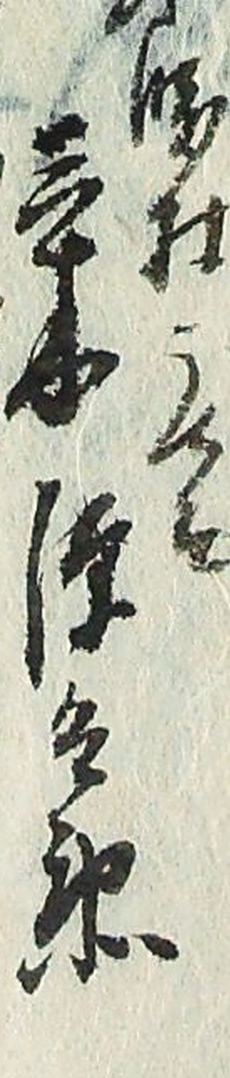三木源兵衛
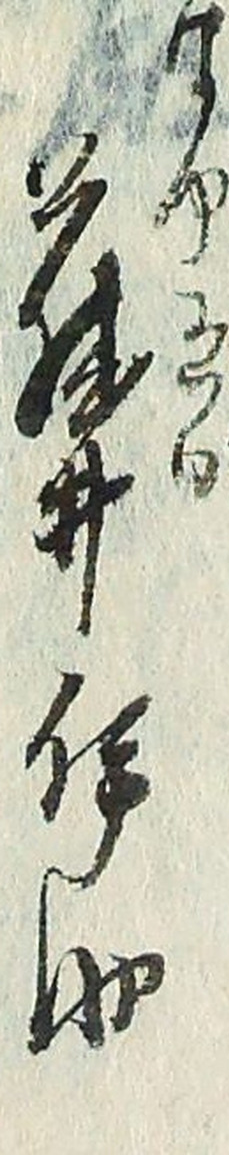藤井伊助
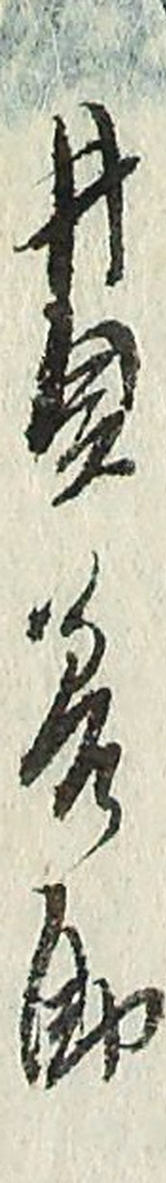井貝善助
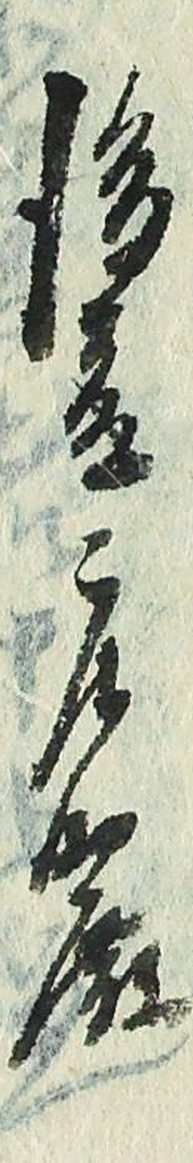後藤庄助殿
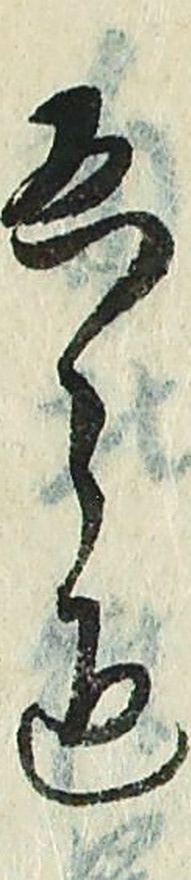右之通
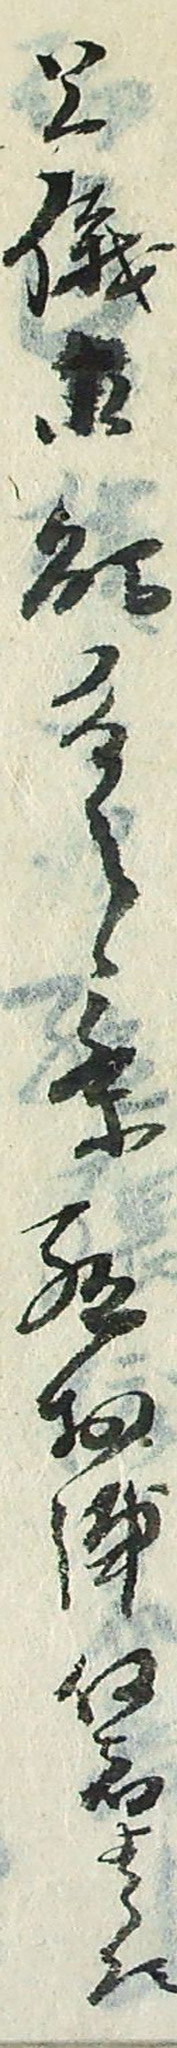公儀御触有之候条組村浦何者よらす
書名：諸御用御□受書控
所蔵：鳴門教育大学 Naruto University of Education
